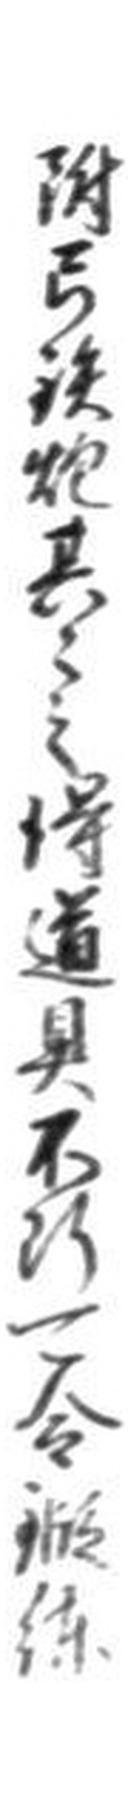附弓鉄砲其々之得道具不断可令鍛練
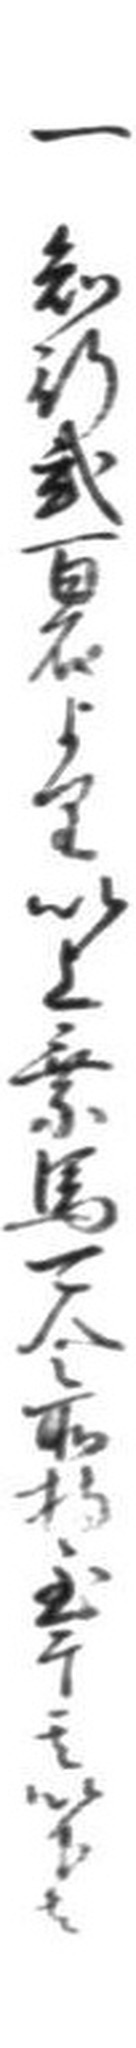一知行弐百石より以上乗馬可令所持至其以下者
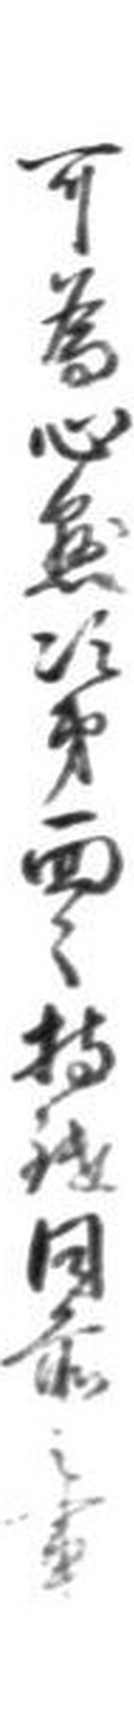可為心懸次第面々持鑓同前之事
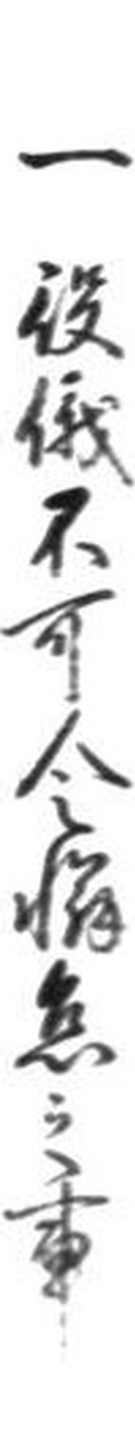一役儀不可令惰怠之事
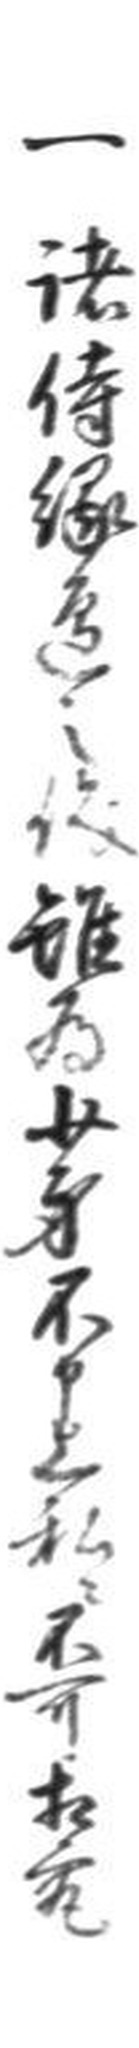一諸侍縁辺之儀雖為女身不申上私ニ不可相宛
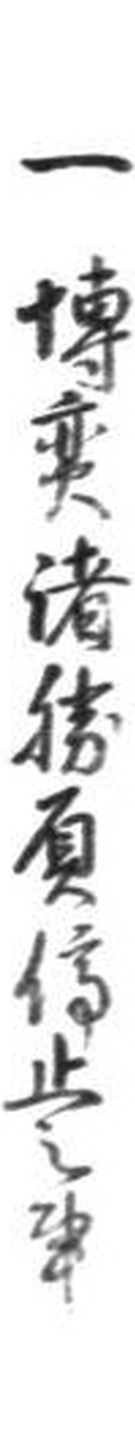一博奕諸勝負停止之事

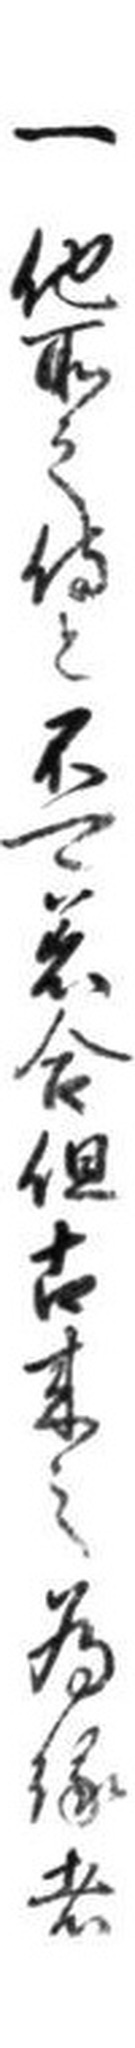一他所之侍と不可着合但古来之為縁者
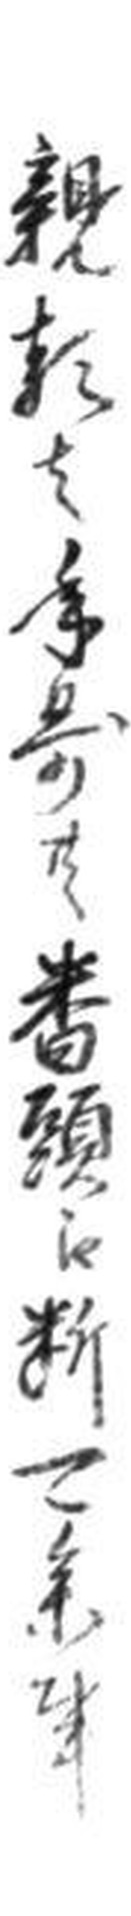親類は年寄共番頭江断可参事
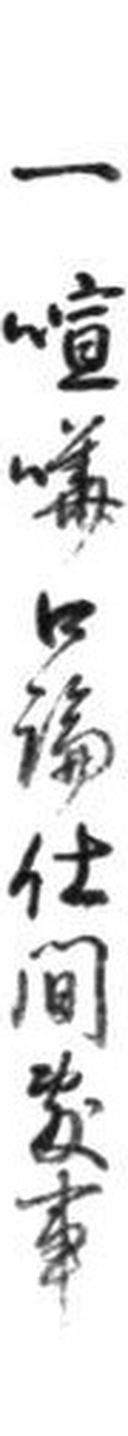一喧嘩口論仕間敷事
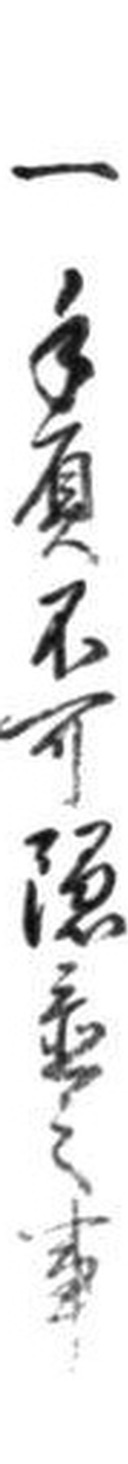一手負不可隠置之事
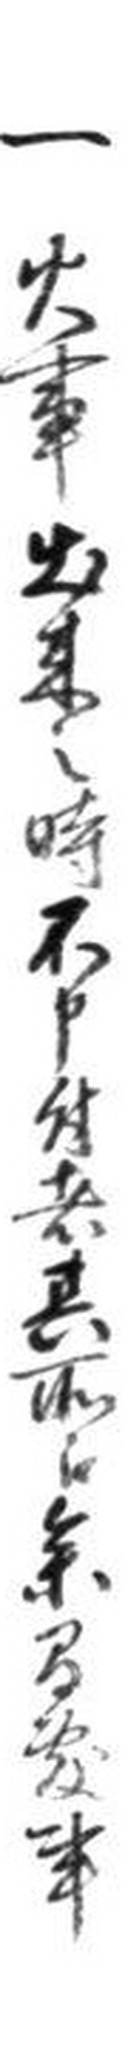一火事出来之時不申付者其所江参間敷事
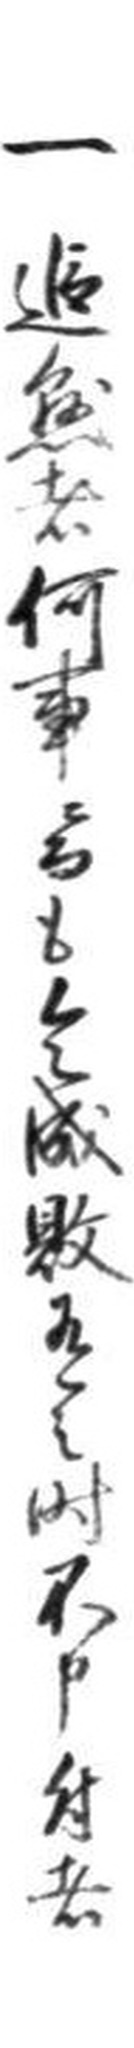一追懸者何事ニ而も令成敗有之時不申付者
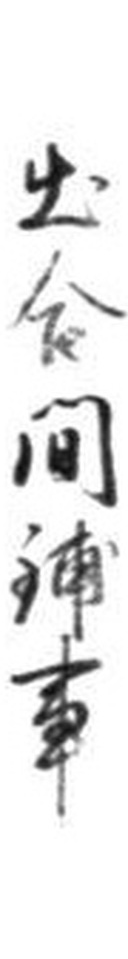出合間鋪事
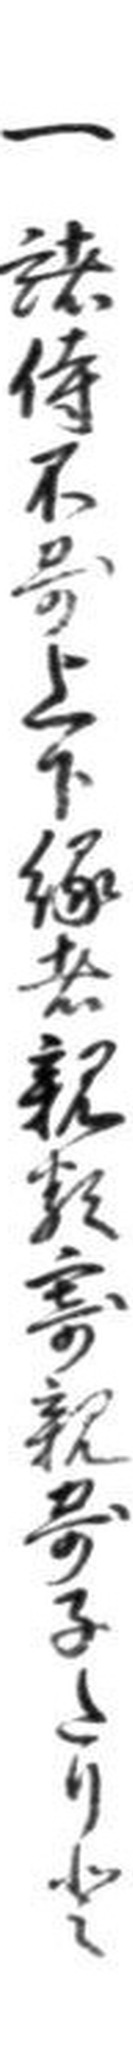一諸侍不寄上下縁者親類寄親寄子たりと
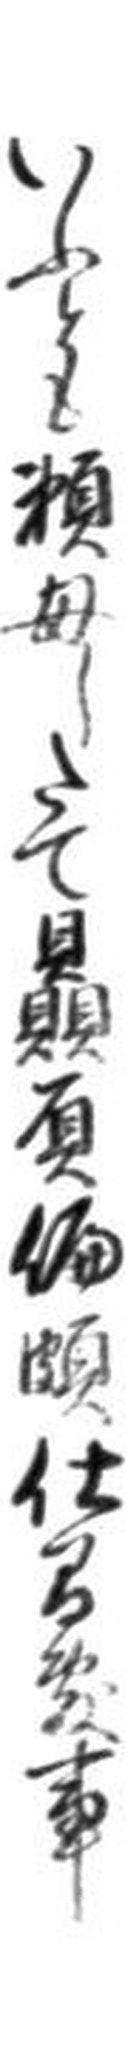いふとも頼母したて贔屓偏頗仕間敷事
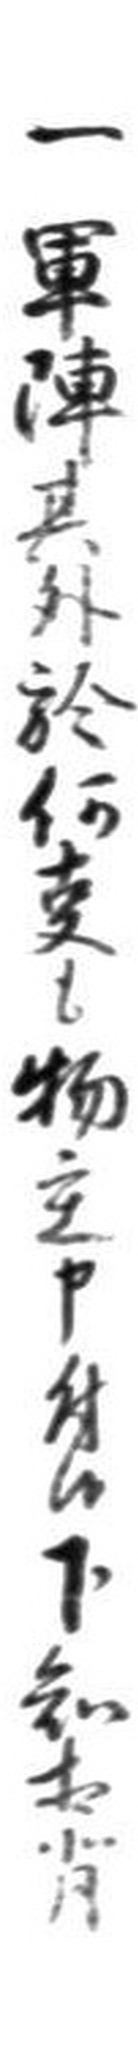一軍陣其外於何事も物立申付候下知相背
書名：家譜 三 忠昌公 従慶長八年到寛永六年
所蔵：福井県文書館 Fukui Prefectural Archives
